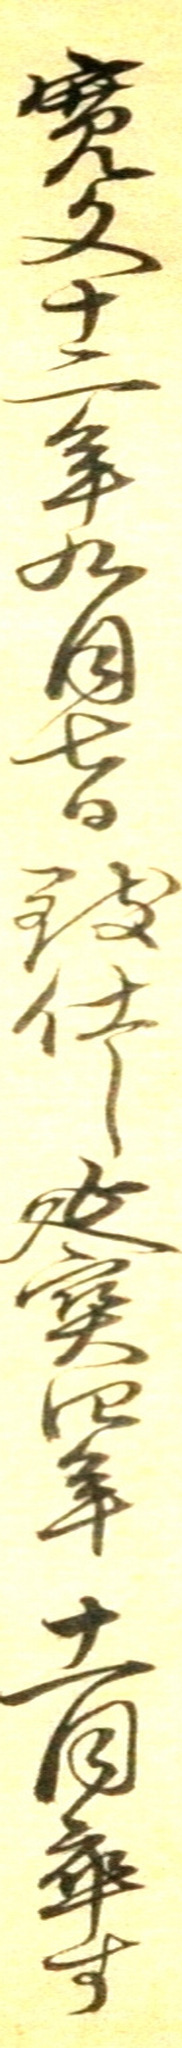寛文十二年九月七日致仕し延宝四年十一月卒す
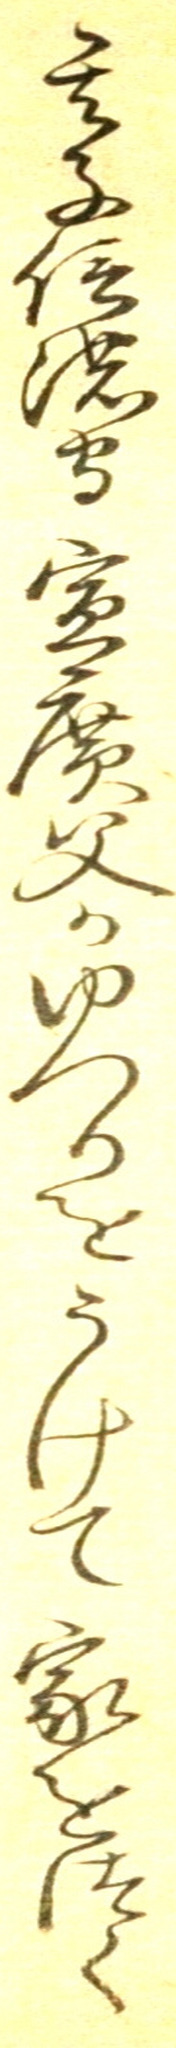其子信濃守宣広父かゆつりをうけて家をつく
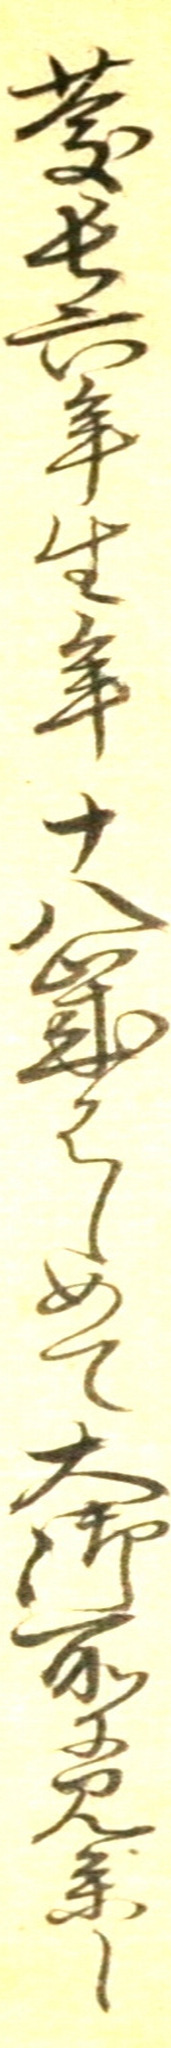慶長六年生年十八歳はしめて大御所に見参し
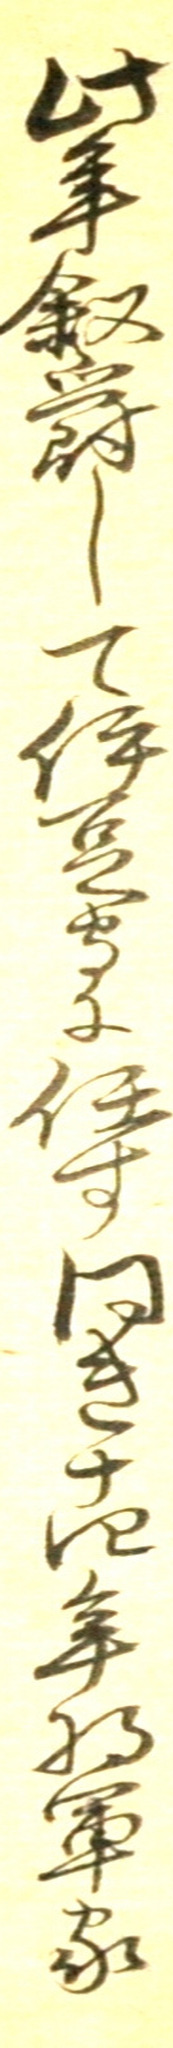此年叙爵して伊豆守に任す同き十余年将軍家
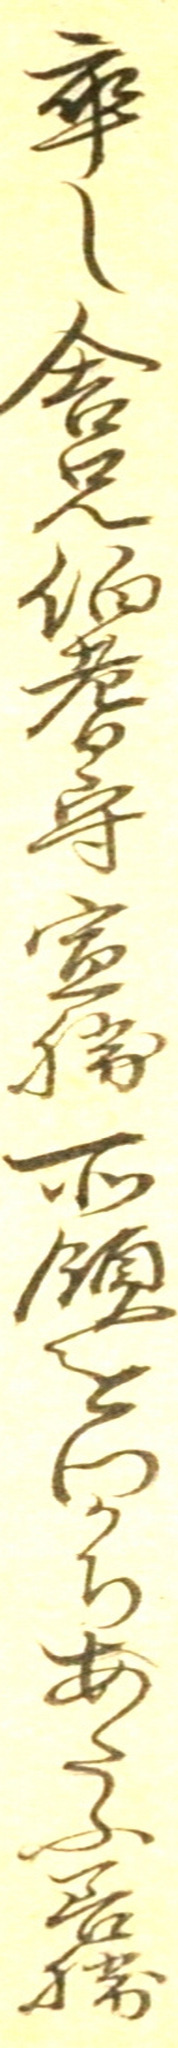卒し舎兄伯耆守宣勝所領をわかちあたふ善勝
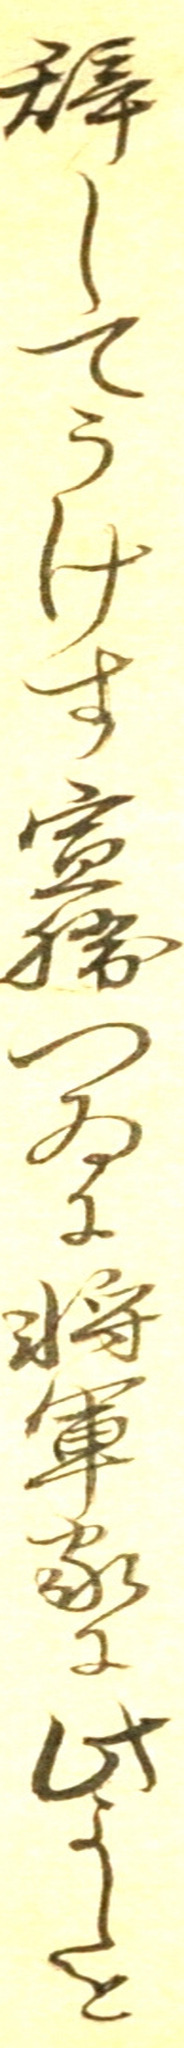辞してうけす宣勝つゐに将軍家に此よしを
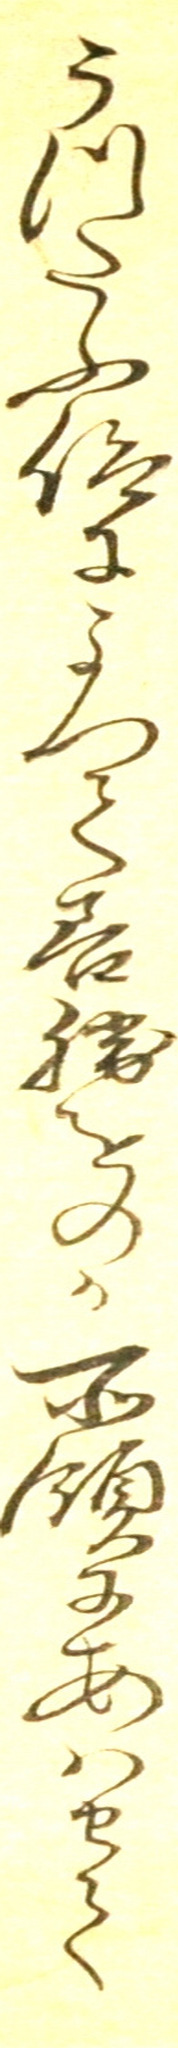うつたふ仰によつて善勝をのか所領にあはせて
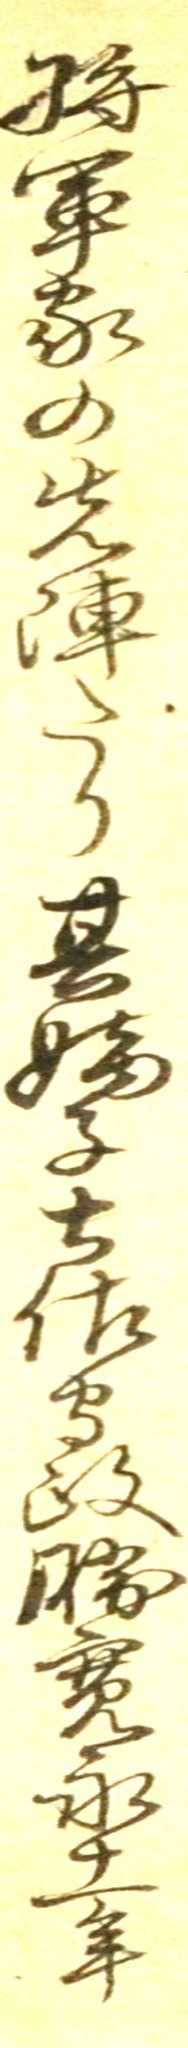将軍家の先陣たり其嫡子土佐守政勝寛永十一年
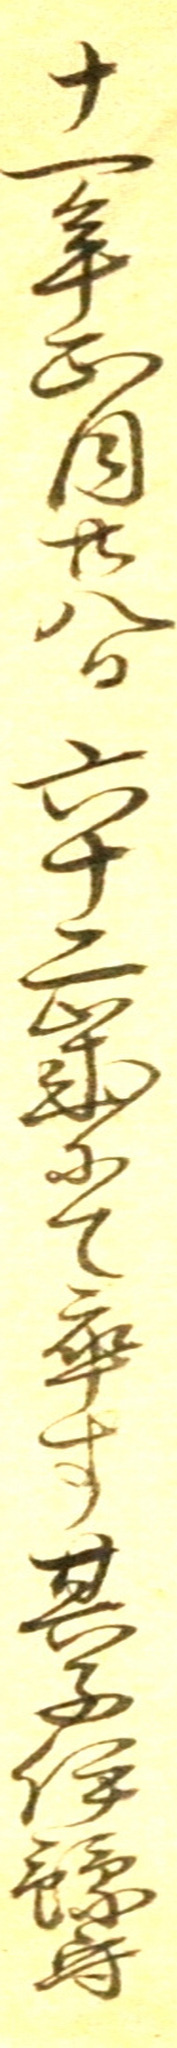十一年正月廿八日六十二歳にて卒す其子伊予守
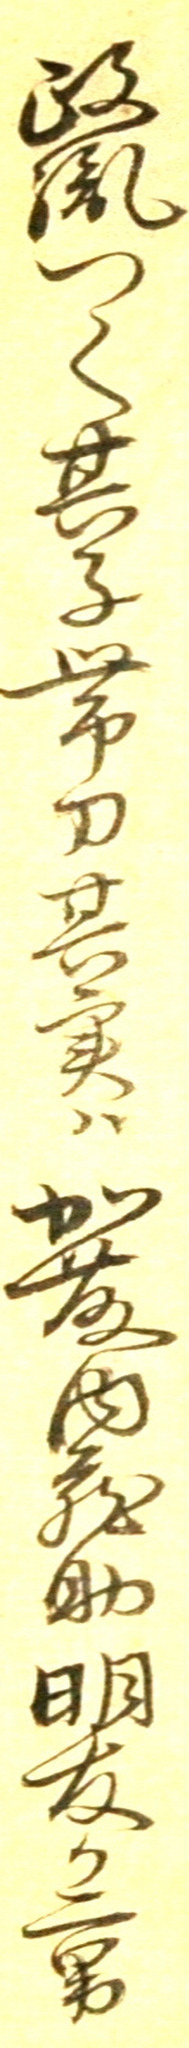政胤つく其子帯刀其実は加藤内蔵助明友か二男

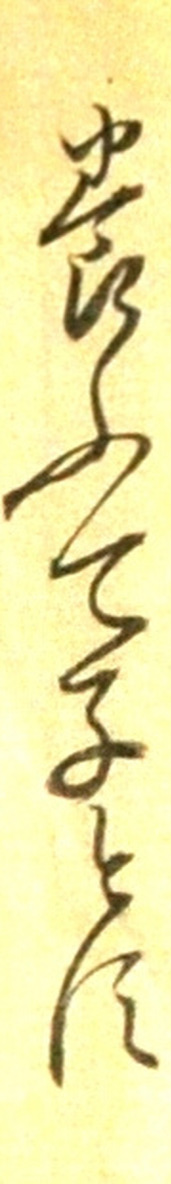養ふて子とす
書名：藩翰譜（九・上）
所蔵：伊那市立高遠町図書館・合同会社AMANE
